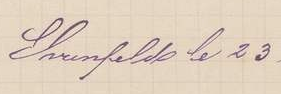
Ehrenfeld le 23
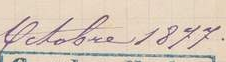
Octobre 1877.
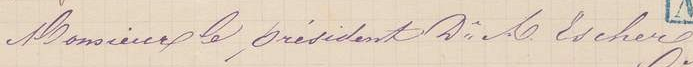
Monsieur le président Dr A. Escher
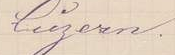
Luzern.
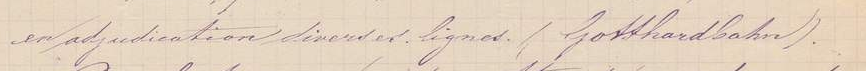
en adjudication diverses lignes (Gotthardbahn).
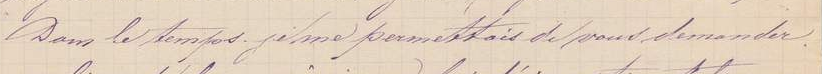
Dans le temps, je me permettais de vous demander
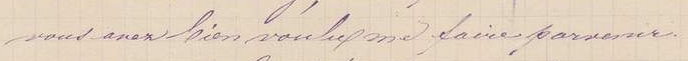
vous avez bien voulu me faire parvenir.
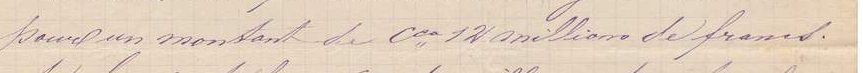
pour un montant de Cca 12 Millions de francs
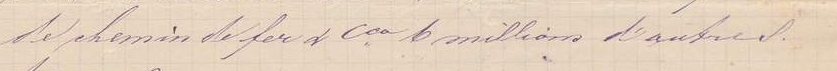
le chemin de fer & Cca 6 millions d'autres
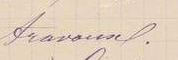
travaux.
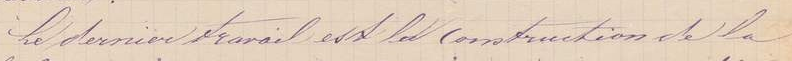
Le dernier travail est la construction de la
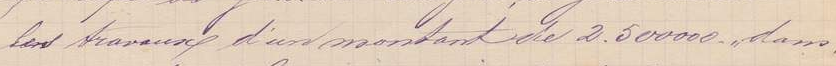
les travaux d'un montant de 2.500000.– dans
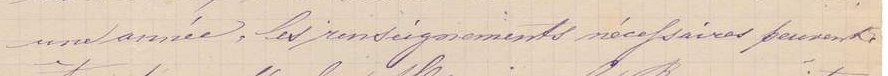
une année. Les renseignements nécessaires peuvent
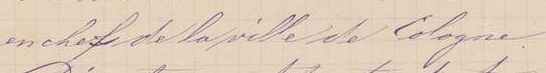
en chef de la ville de Cologne.
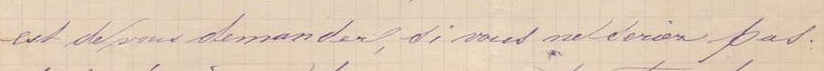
est de vous demander, si vous ne seriez pas
